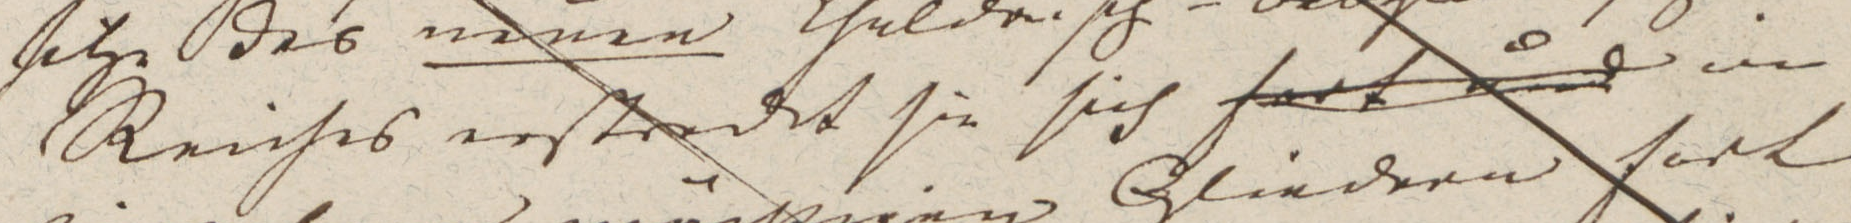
Reiches erstreckt sie sich fort und in
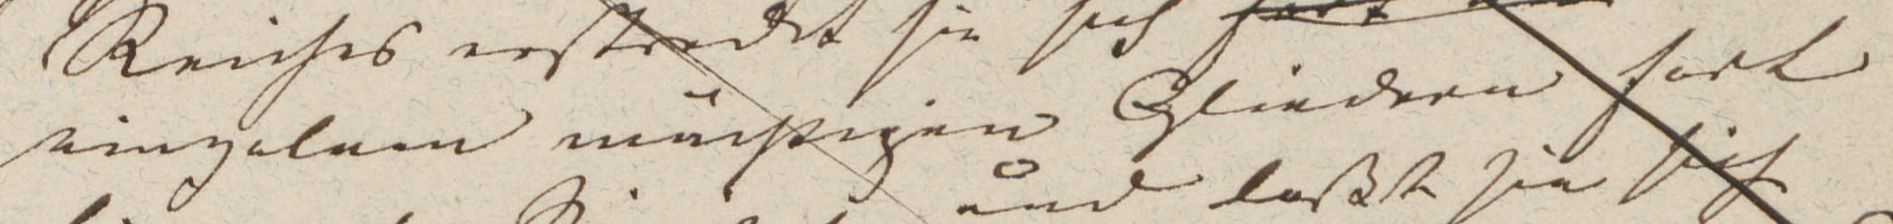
einzelnen mächtigen Gliedern fort
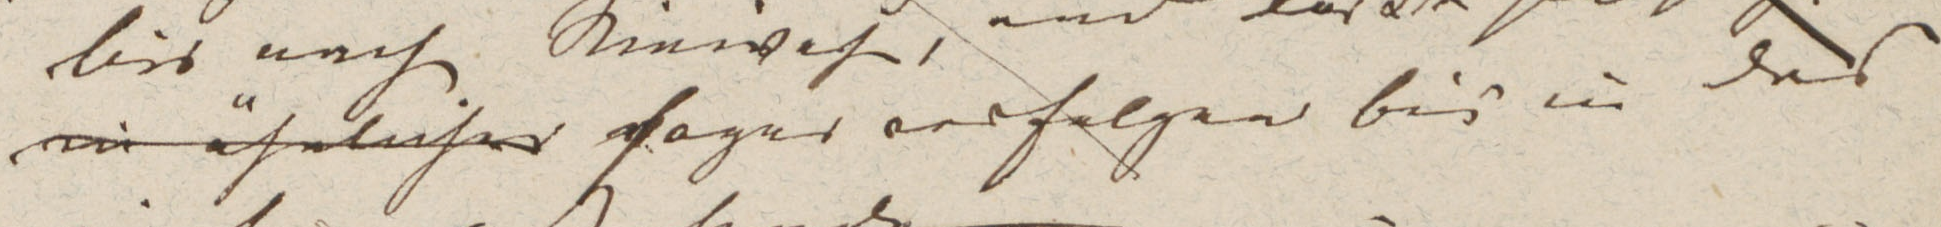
in ähnlicher sogar verfolgen bin in das
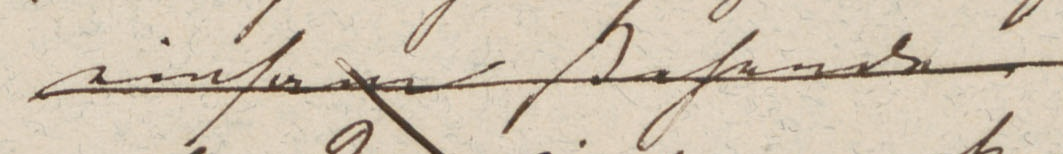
einsam stehende
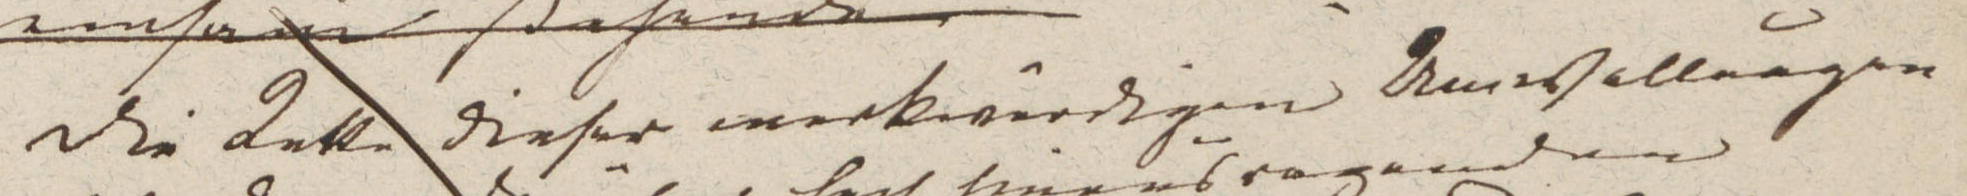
Die Kette dieser merkwürdigen Umwallungen
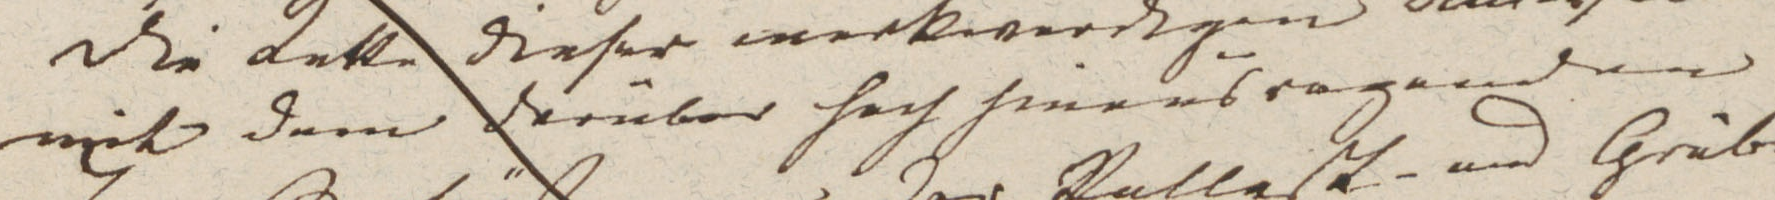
mit dem darüber hoch hinausragenden
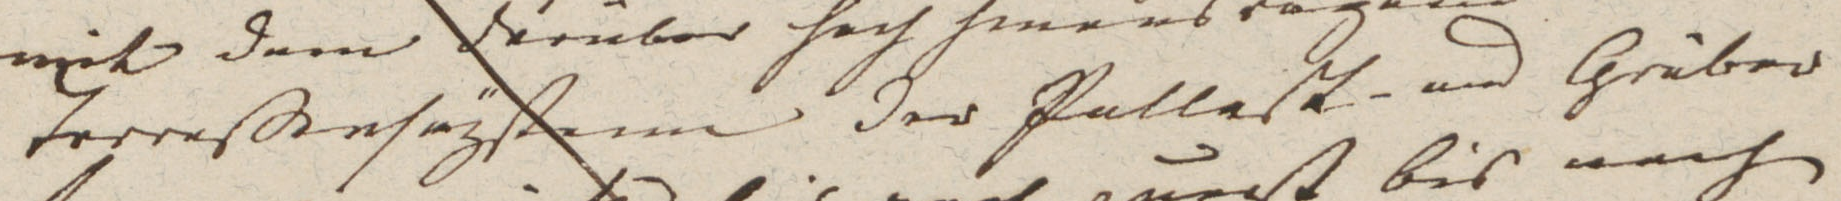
Terrassensysteme das Pallast- und Gräber-
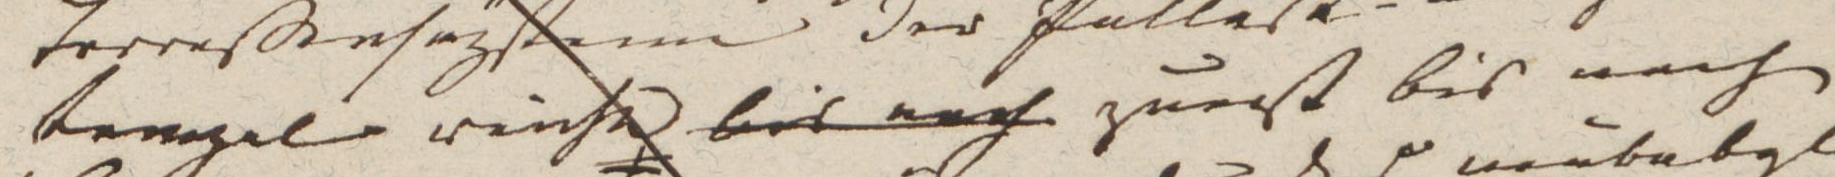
tempel reicht bis nach zuerst bis nach
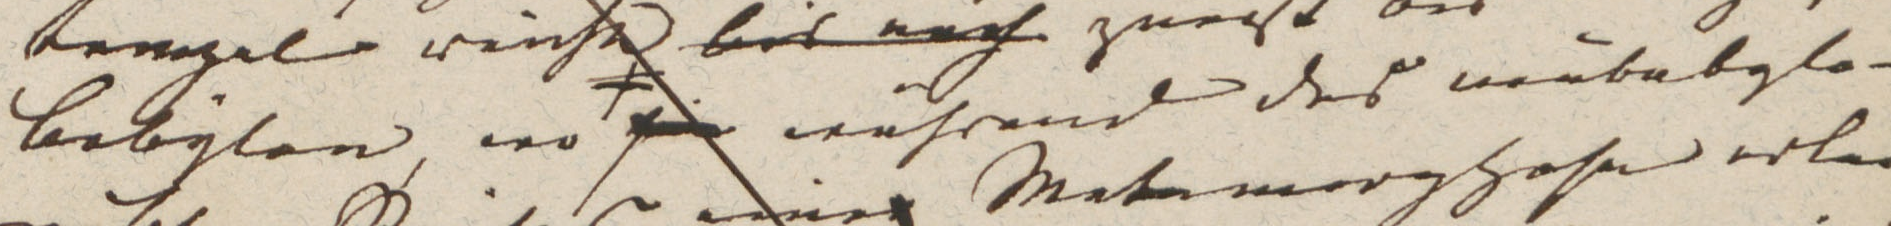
Babylon, wo sie % während des neubabylo-
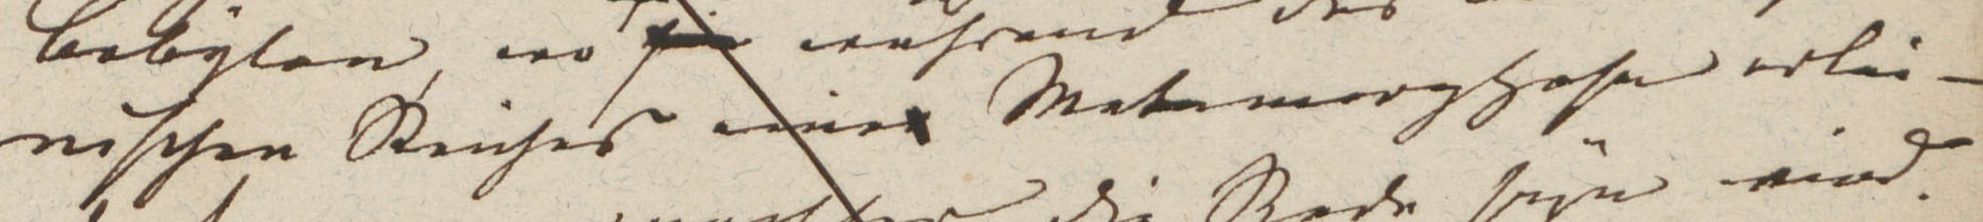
nischen Reiches eine Metamorphose erlei-
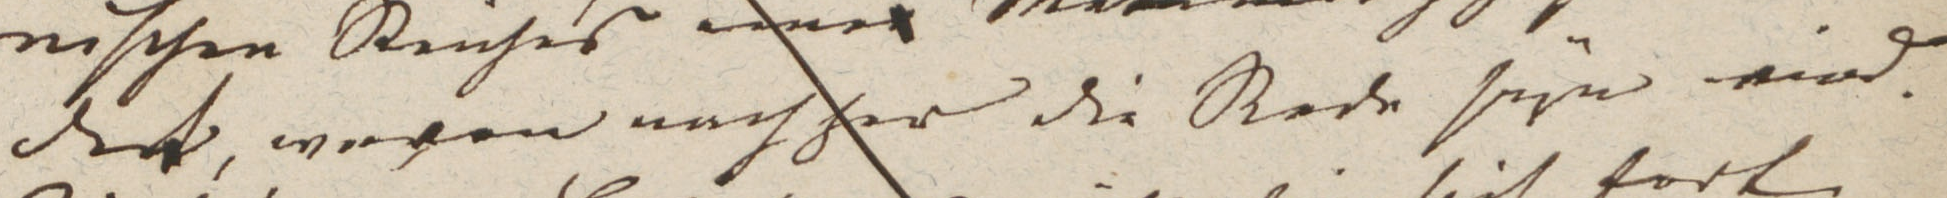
dent, wovon nachher die Rede seyn wird.
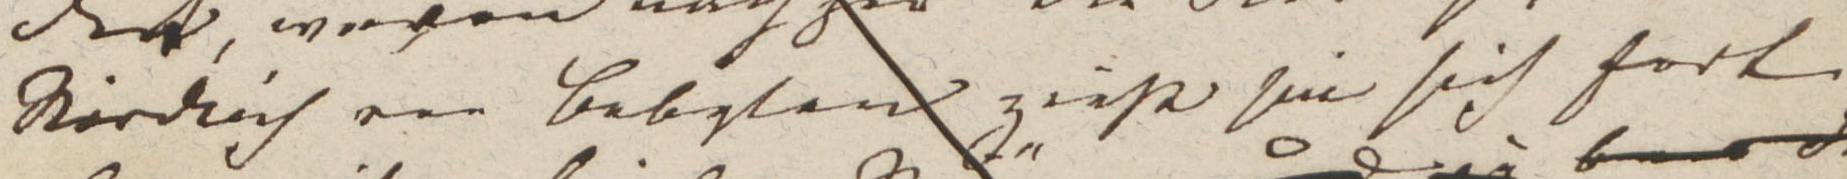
Nördlich von Babylon zieht sie sich fort
